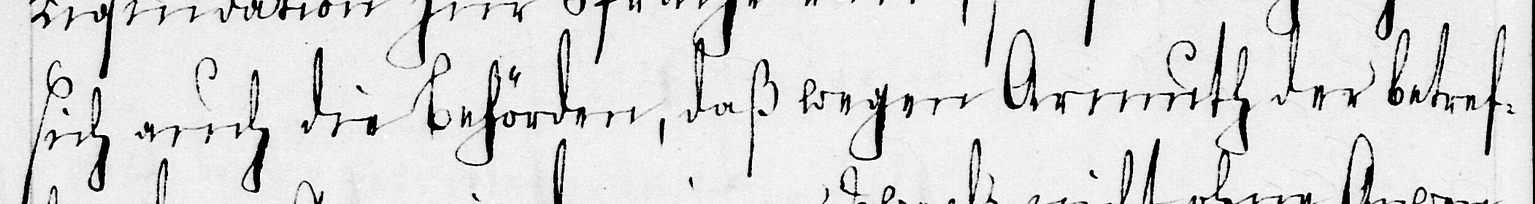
sich auch die Behörden, daß wegen Armuth der betref¬
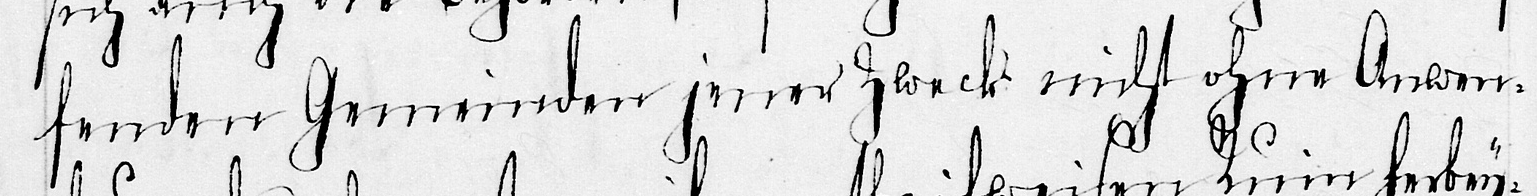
fenden Gemeinden jener Zweck nicht ohne Anwen¬
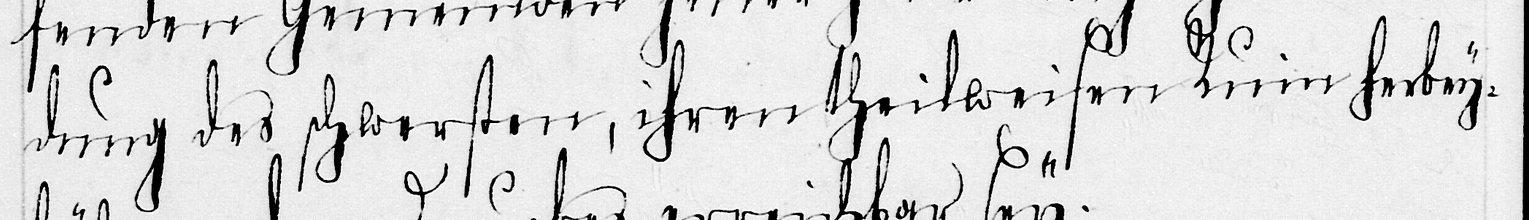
dung des schwersten, ihren theilweisen Ruin herbey¬
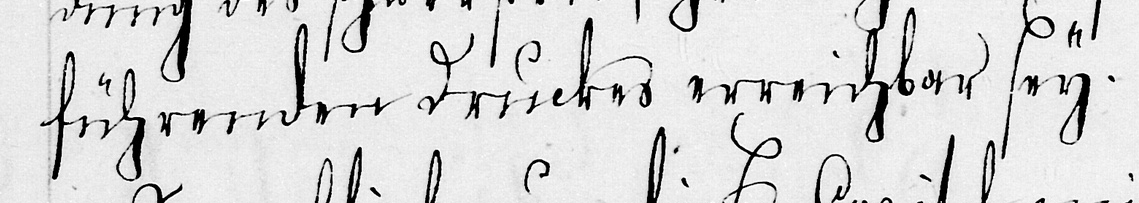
führenden Druckes erreichbar sey.
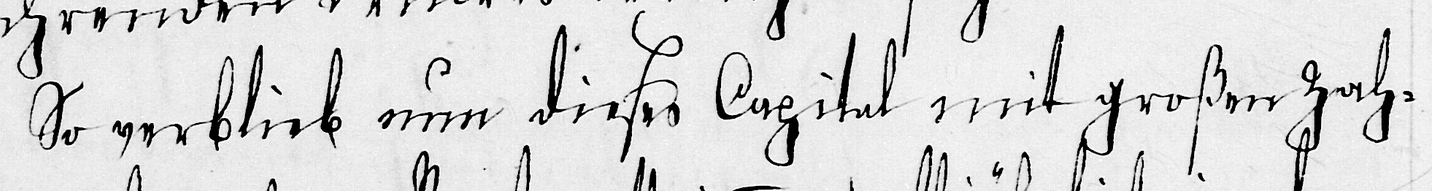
So verblieb nun dieses Capital mit großen Zah¬
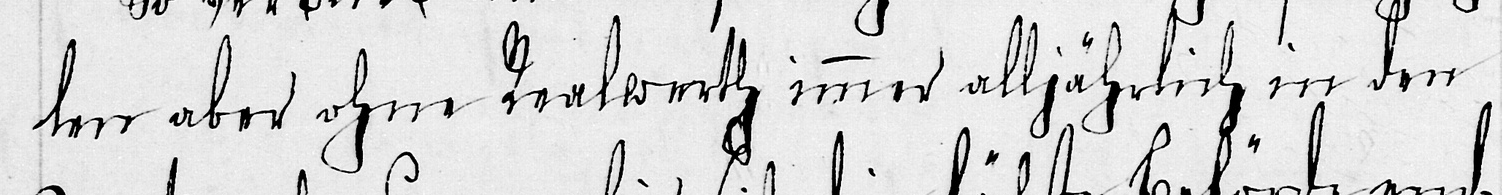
len aber ohne Realwerth immer alljährlich in den
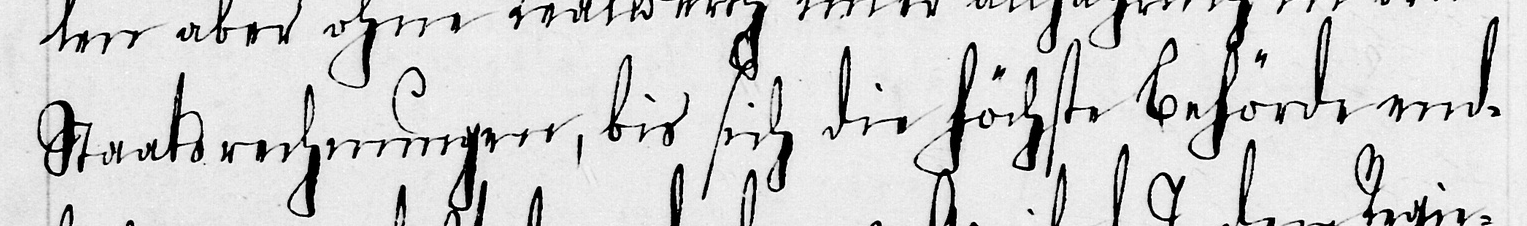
Staatsrechnungen, bis sich die Höchste Behörde end¬
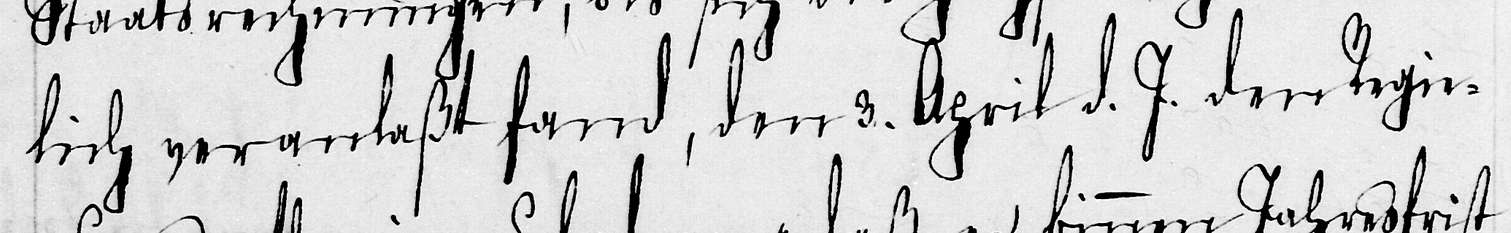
lich veranlaßt fand, den 3. April d. J. den Regie¬
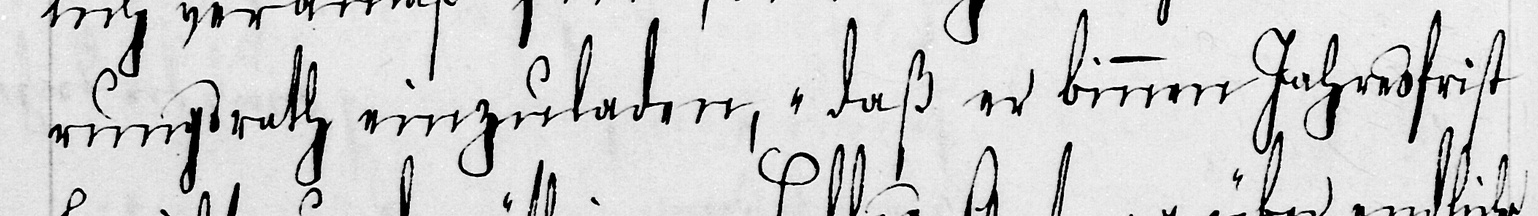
rungsrath einzuladen, „daß er binnen Jahresfrist
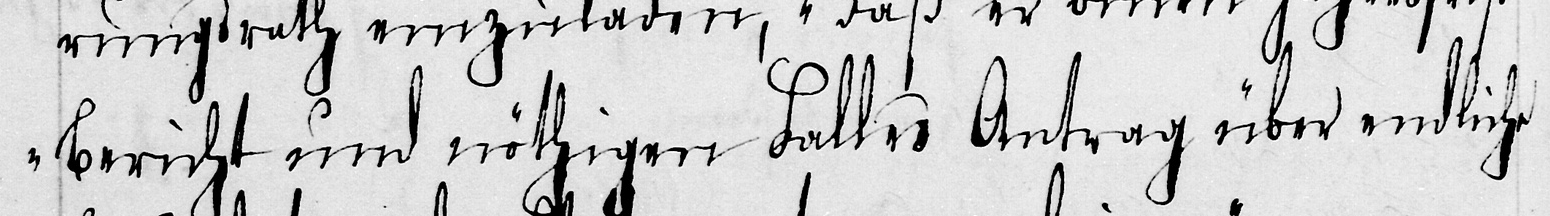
Bericht und nöthigen Falles Antrag über endliche
